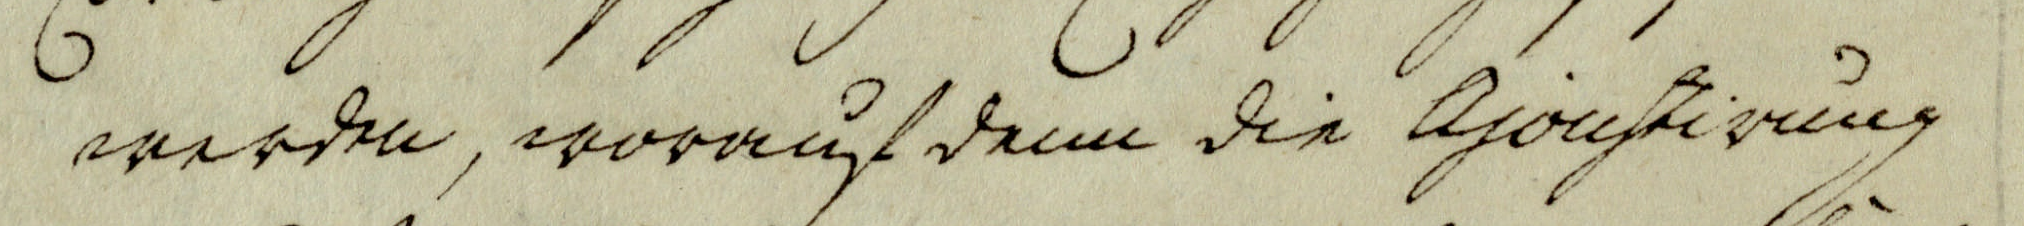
werden, worauf denn die Ajoustirung
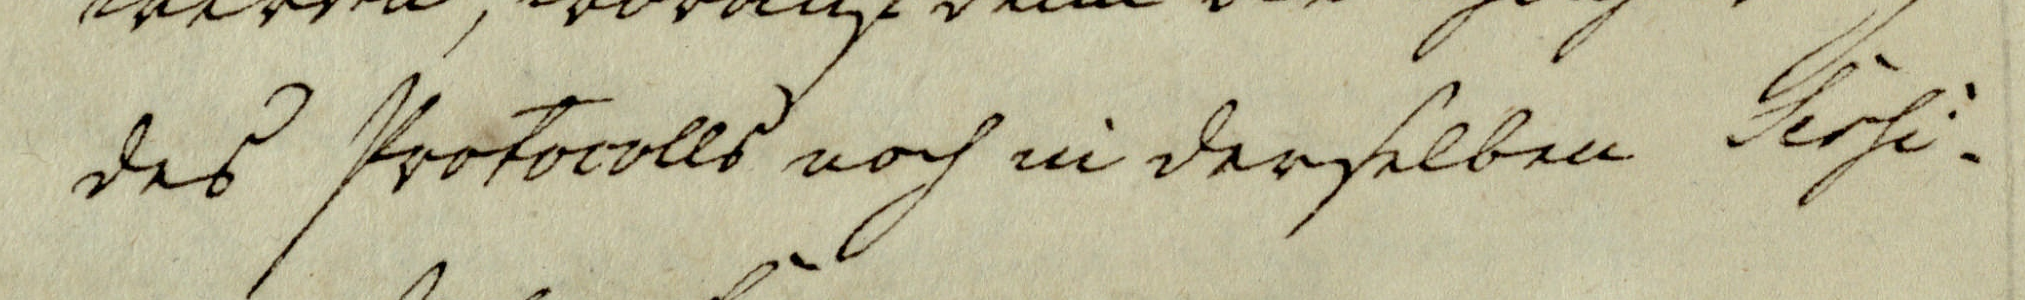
des Protocolls noch in derselben Sessi¬
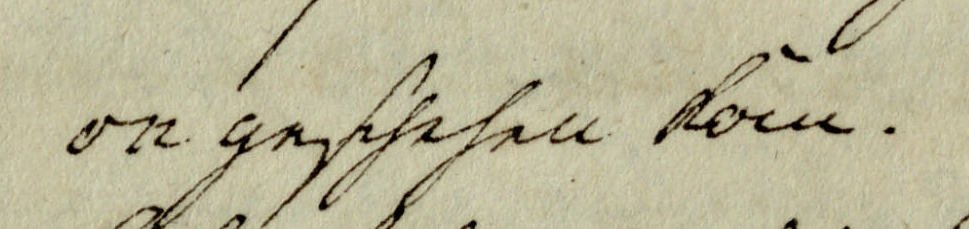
on geschehen kan.
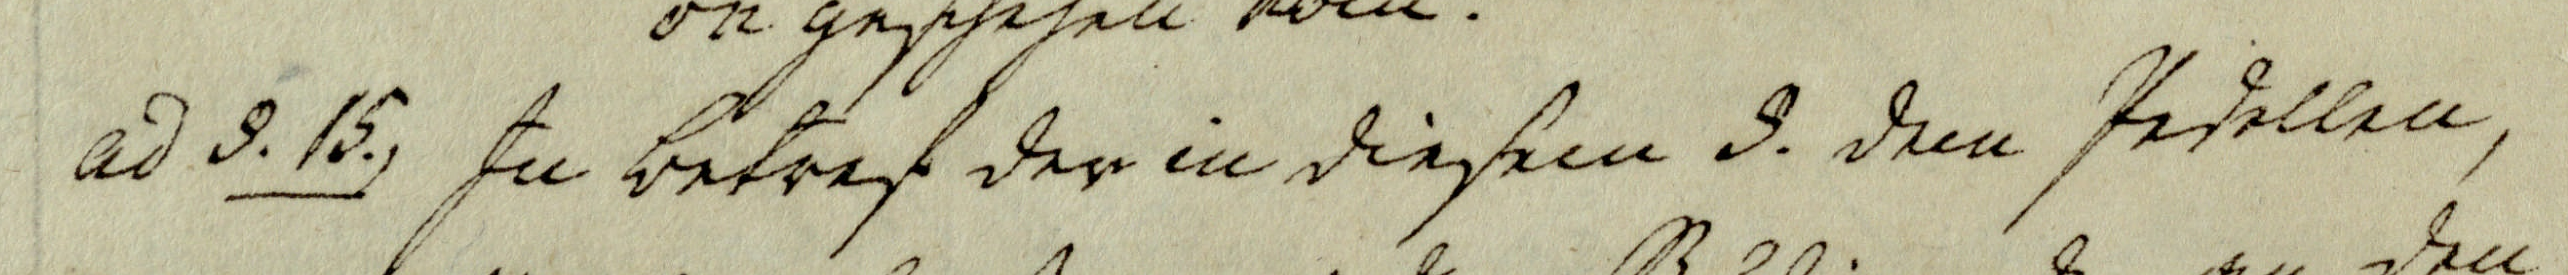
ad §. 15., In Betref der in diesem §. dem Pedellen,
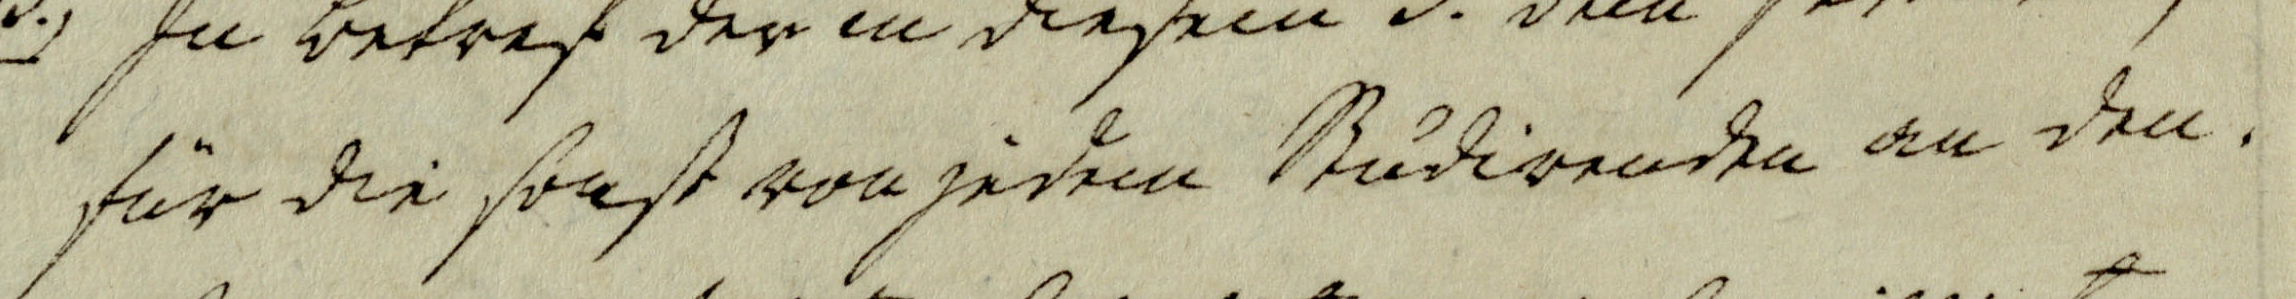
für die sonst von jedem Studirenden an den¬
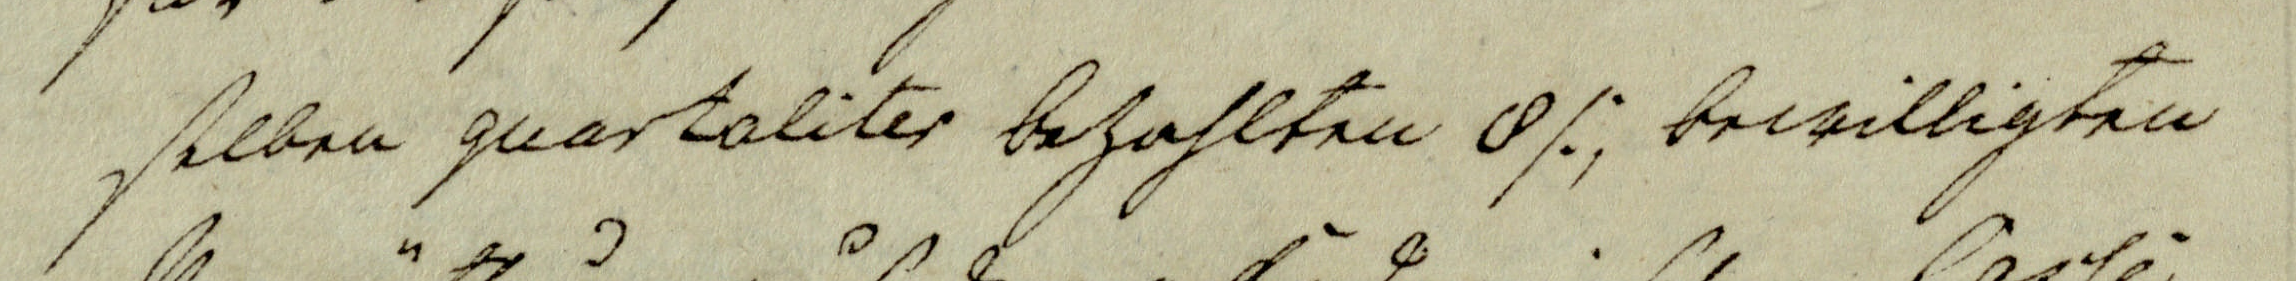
selben quartaliter bezahlten 8 s. bewilligten
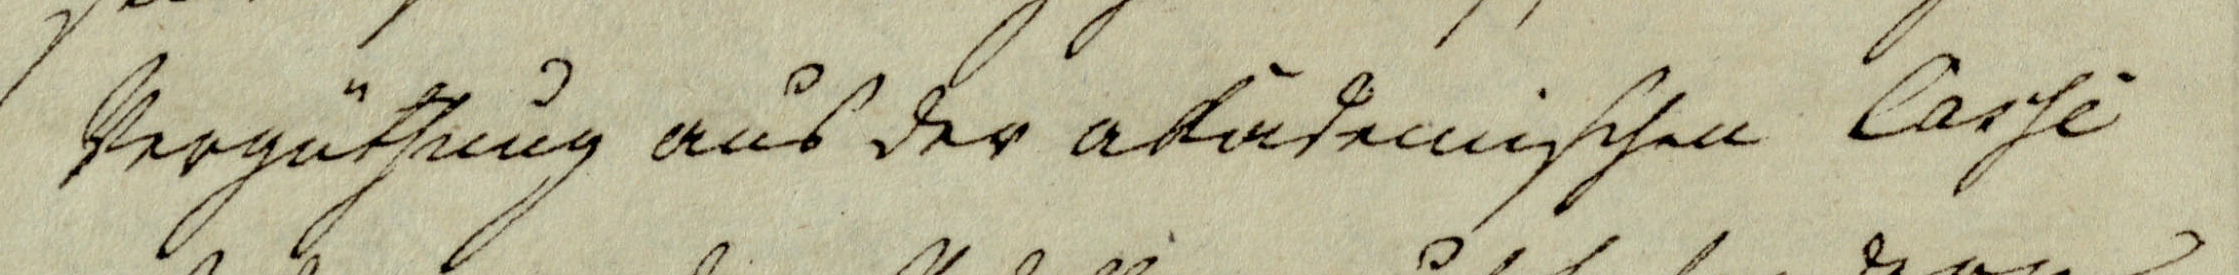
Vergüthung aus der akademischen Casse
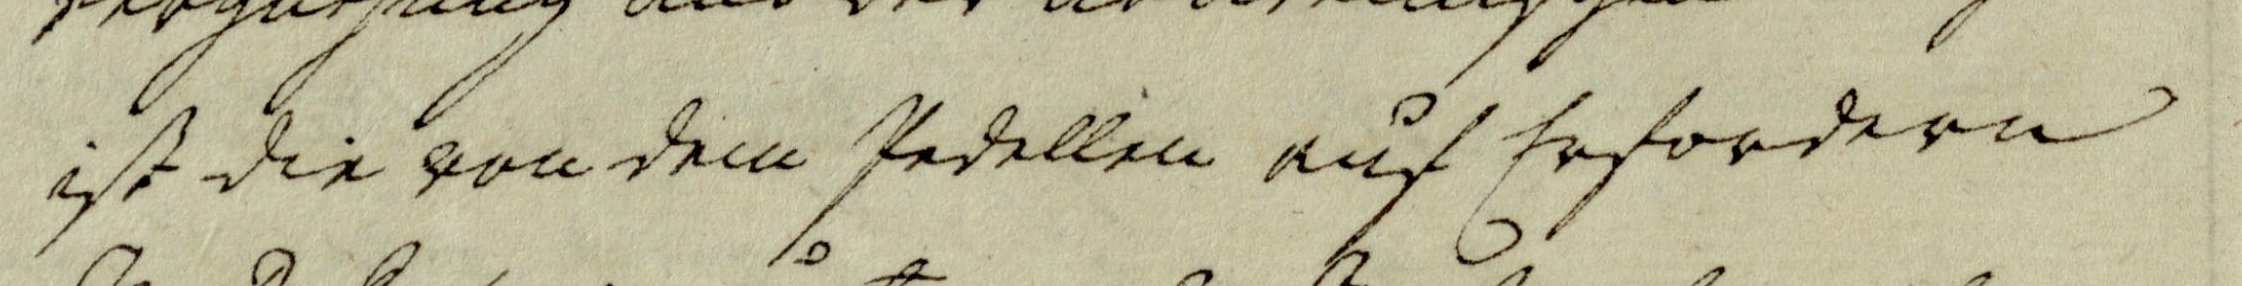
ist die von dem Pedellen auf Erfordern
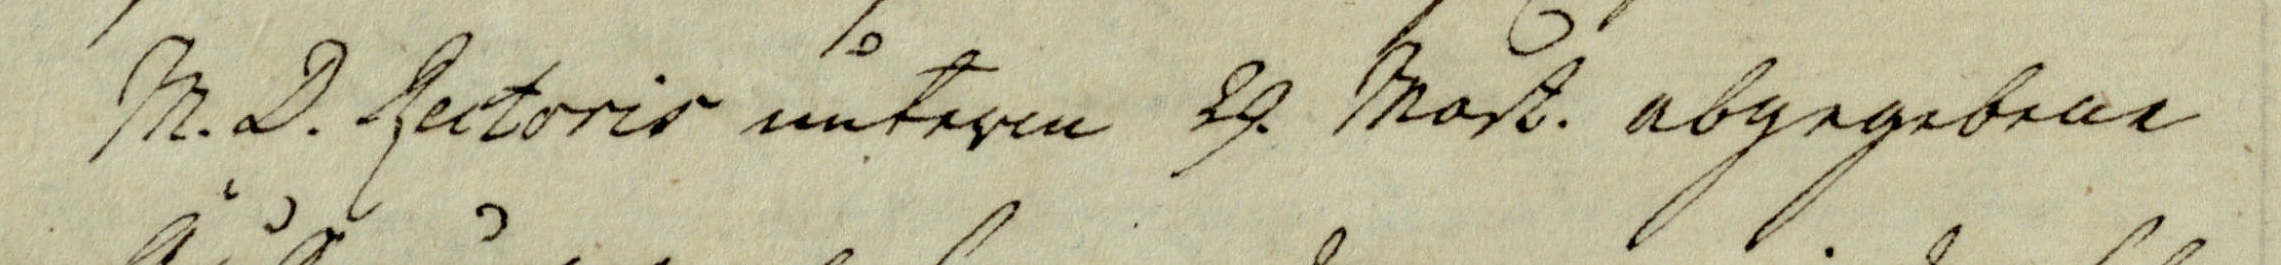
M. D. Rectoris unterm 29 Mart. abgegebene
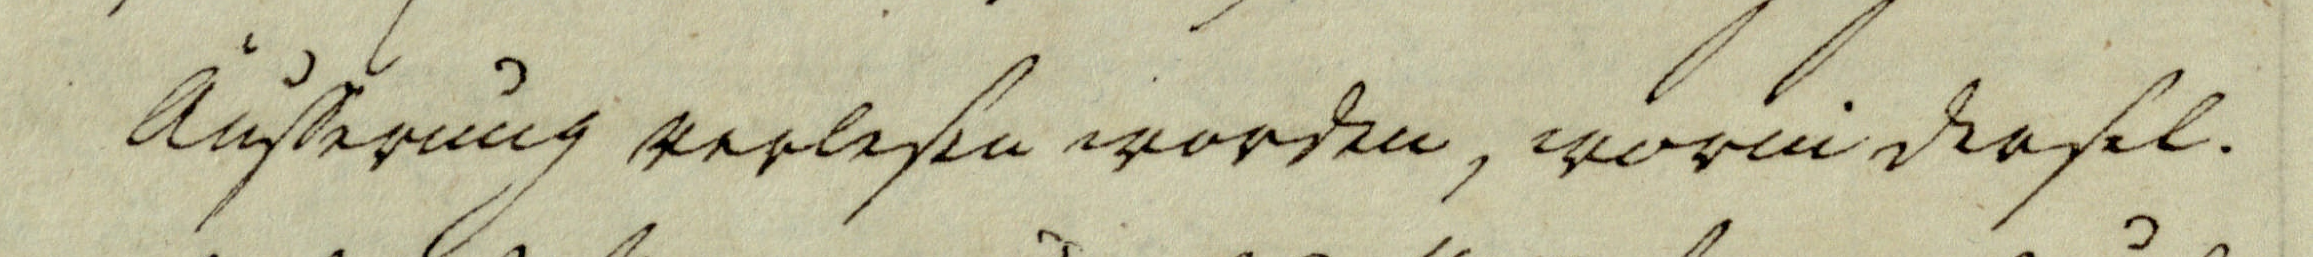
Äusserung verlesen worden, worin dersel¬
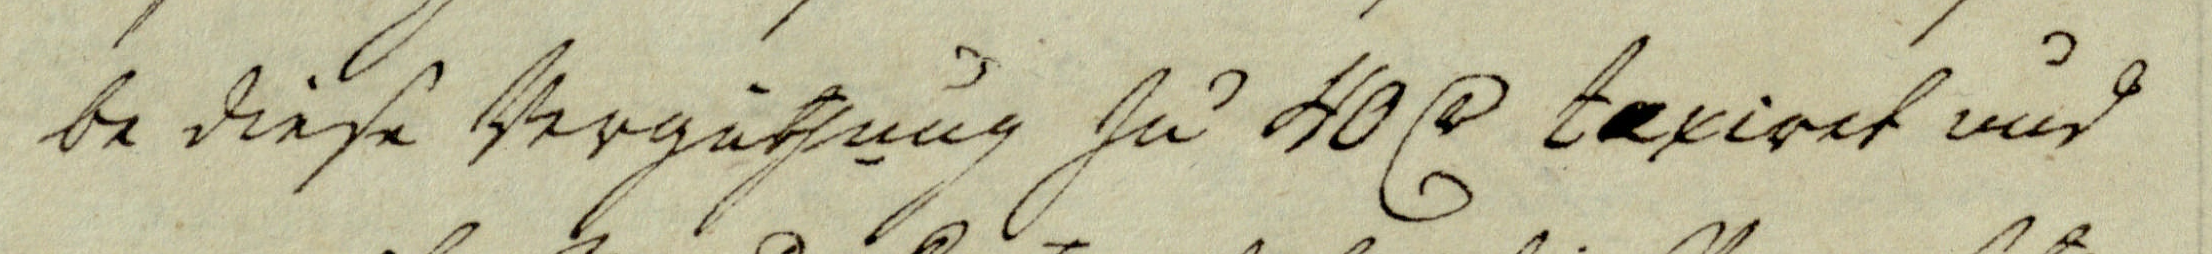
be diese Vergüthung zu 40 l. taxiret und
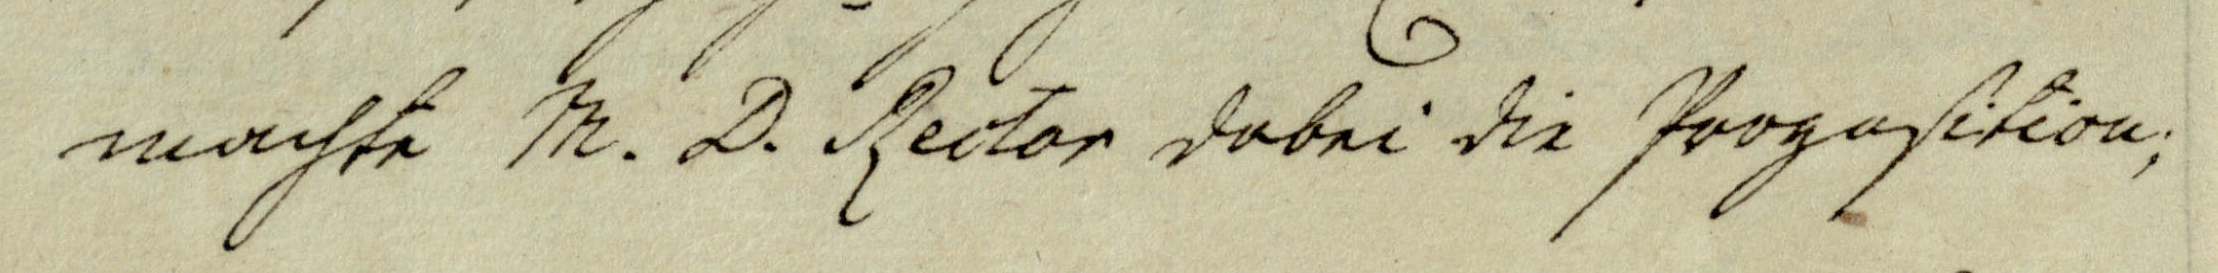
machte M. D. Rector dabei die Proposition,
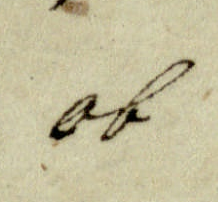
ob
